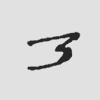乃
